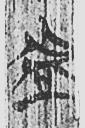者
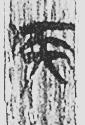侯
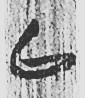㠯（以）
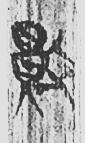敗
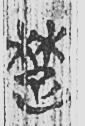楚
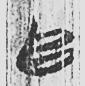𠂤
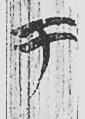于
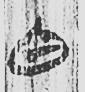白
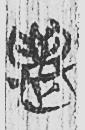𪴿
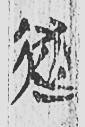述
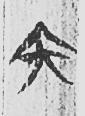內
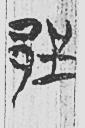郢
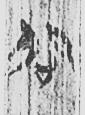卲
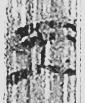王
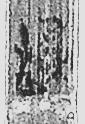{𡴎帚}
